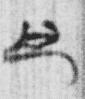也
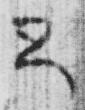已
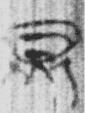鼎（則）
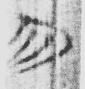勿
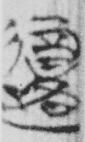○（復）
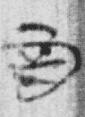言
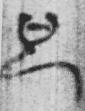也
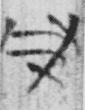凡
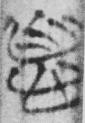憂
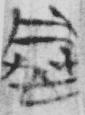惓（患）
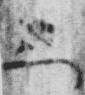之
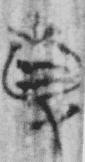事
